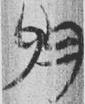於
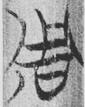周
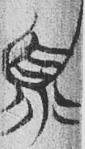○（寡）
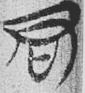君
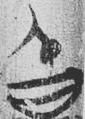昏（問）
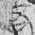左
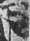右
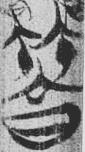○（孰）
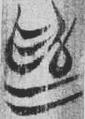爲
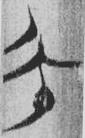帀（師）
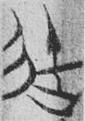徒
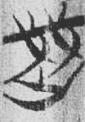{戔至}（踐）
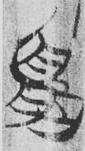{舟頁止}（履）
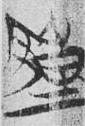{阜東土}（陳）
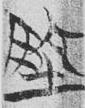{阜它土}（地）
